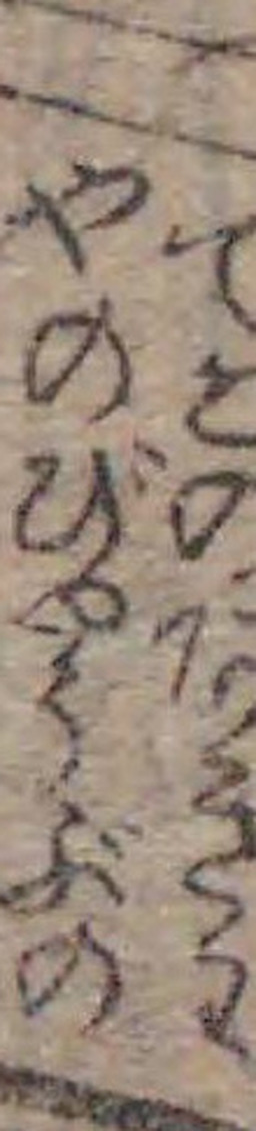やのびやうぶの
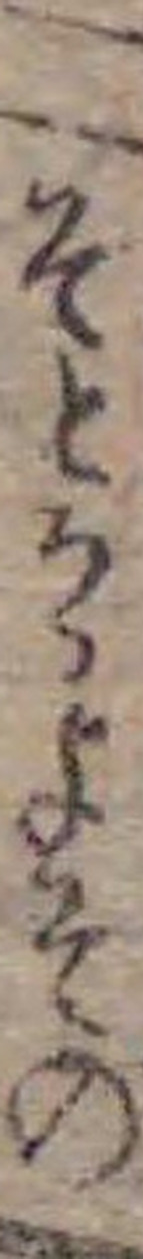そとからよその
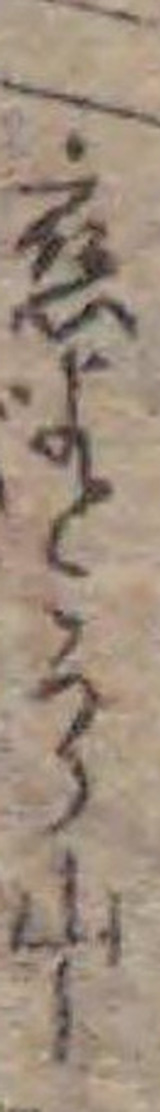恋よとうら山し
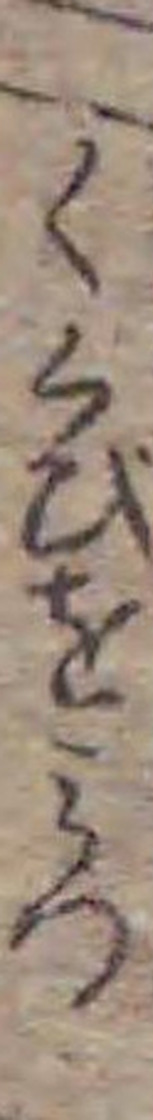くくびをみつ
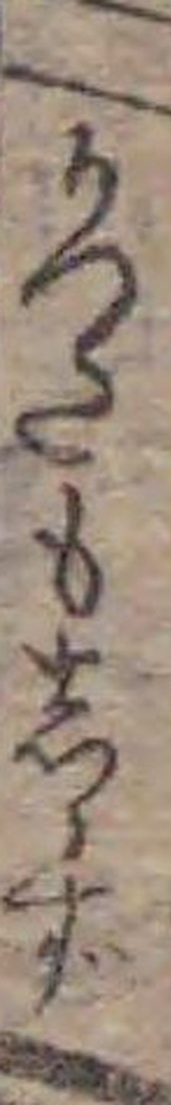かつたもしらず
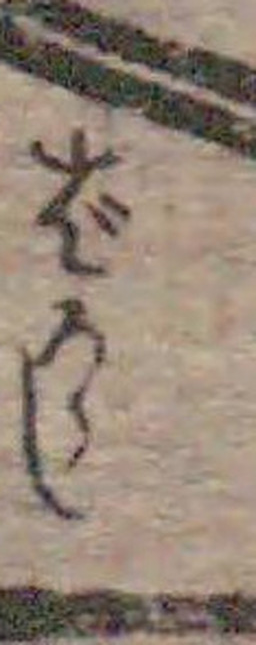ばからし
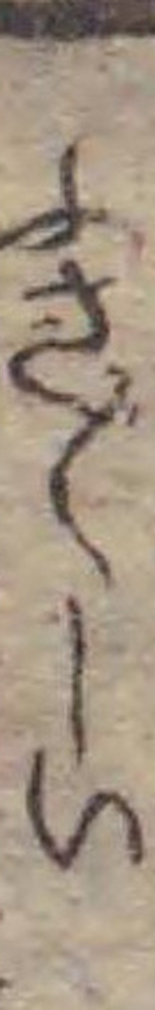ふさ〳〵しい
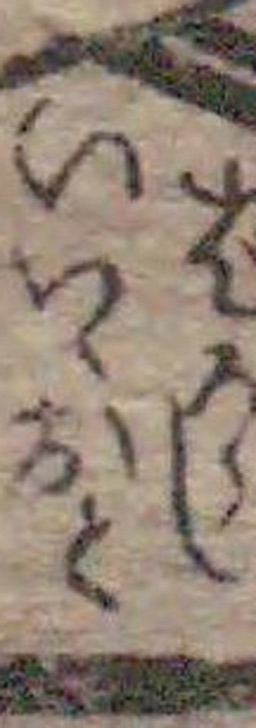いいゝおと
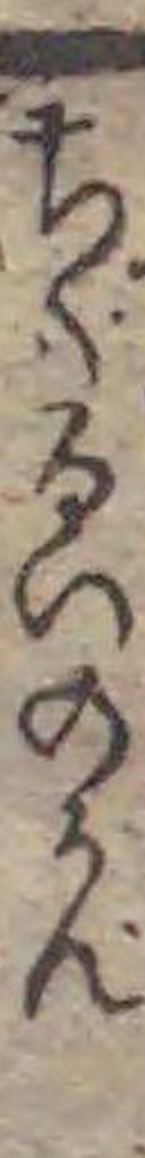ちくるいのうん
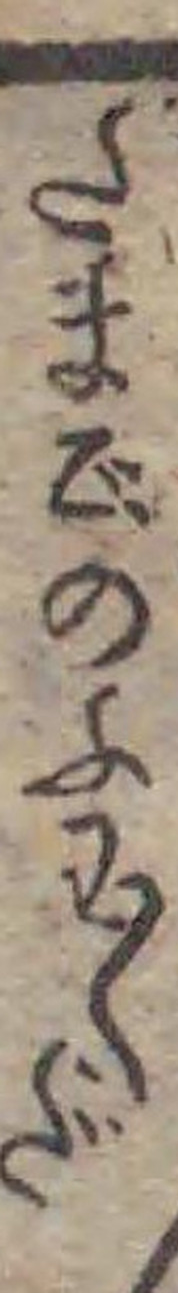たまごのふわ〳〵だ
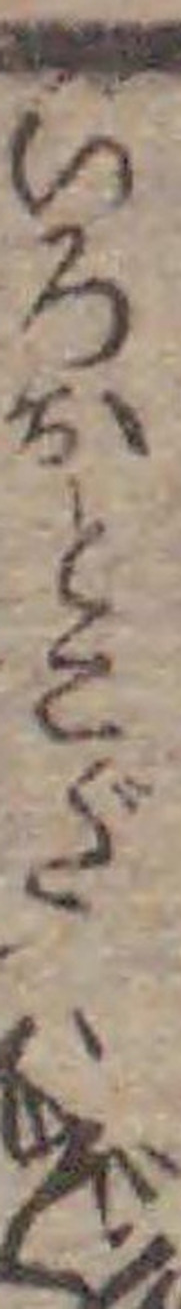いろおとこだ
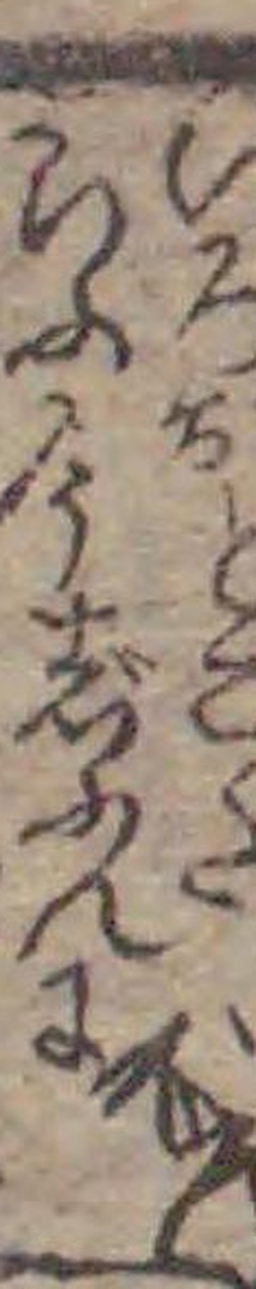らふ今じぶんに
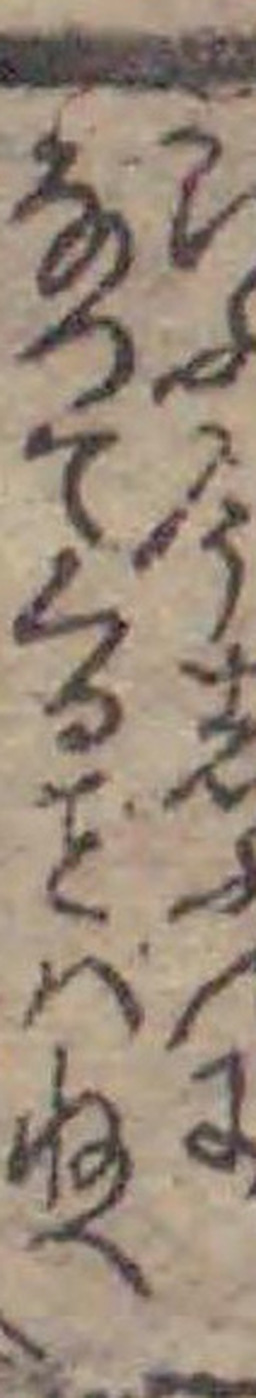なつてくることはねへ
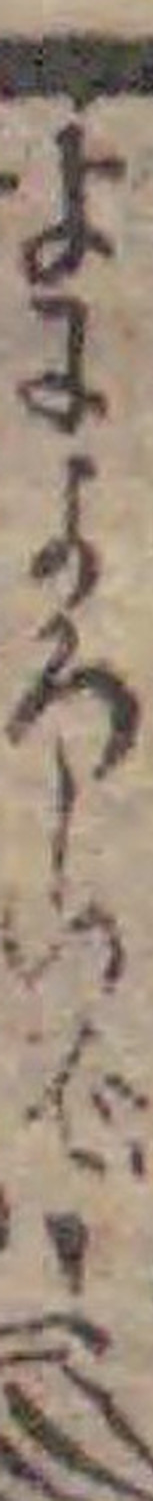よによろしいで
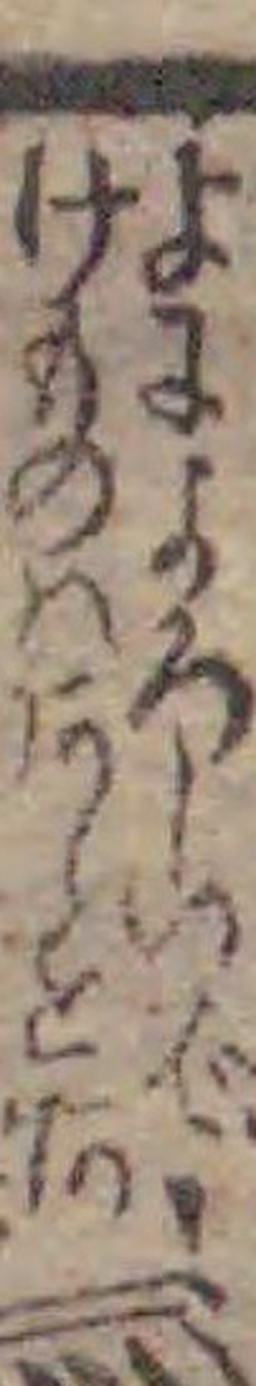けものはあしをあ

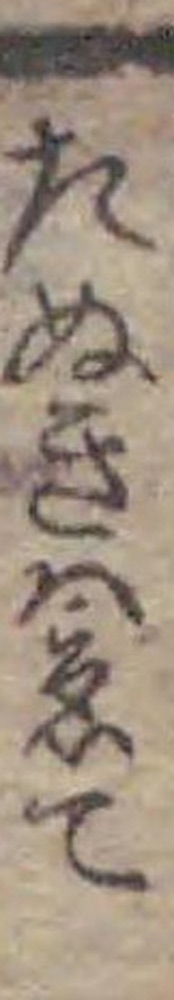たぬきはゑて
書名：化物楽屋異牒 : 2巻
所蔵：国立国会図書館 National Diet Library, JAPAN
